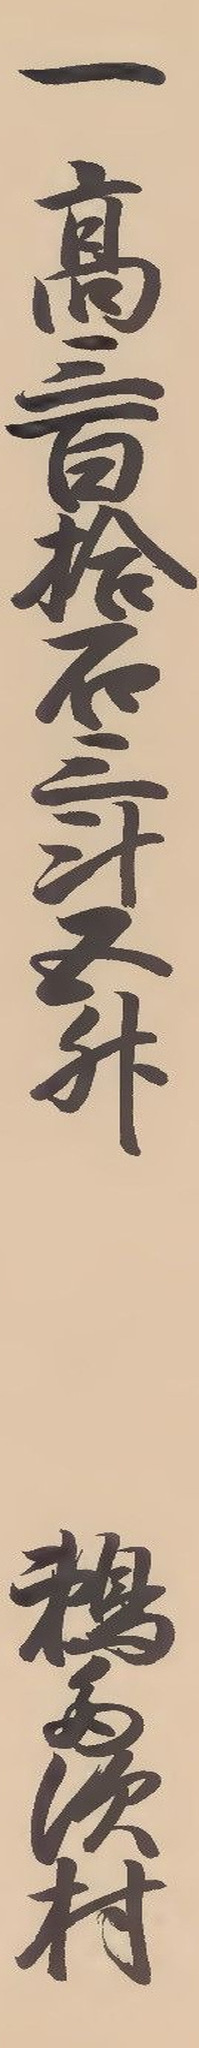一高三百拾石三斗五升鵜多須村
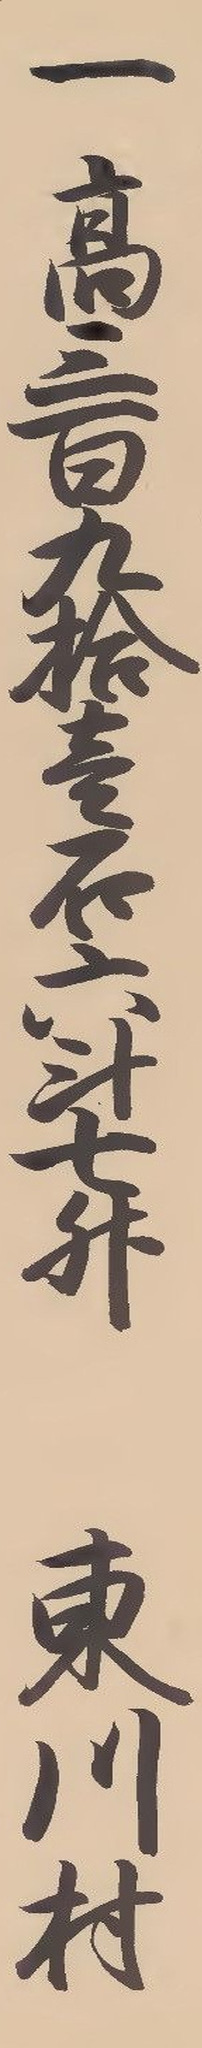一高三百九拾壱石六斗七升東川村
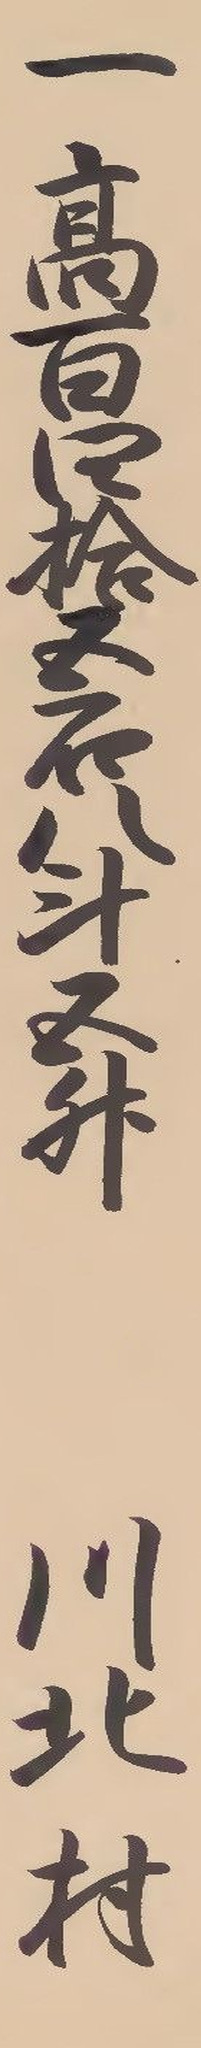一高百四拾五石八斗五升川北村

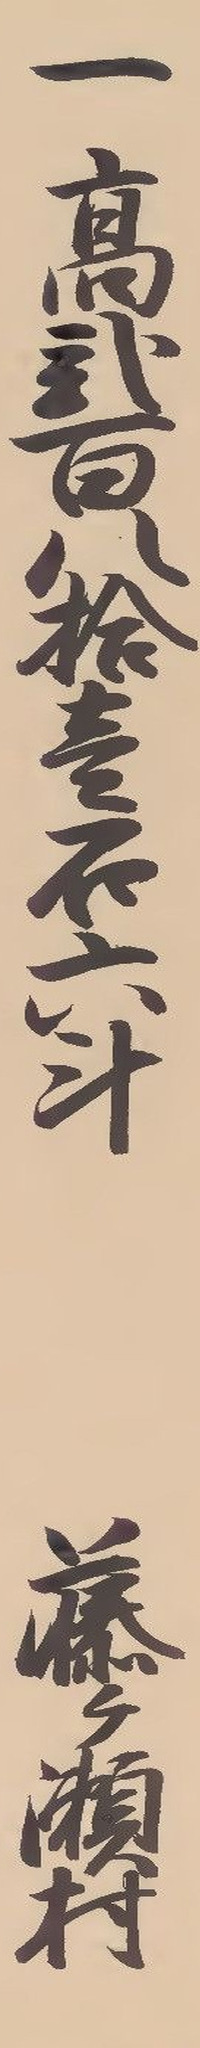一高弐百八拾壱石六斗藤ヶ瀬村
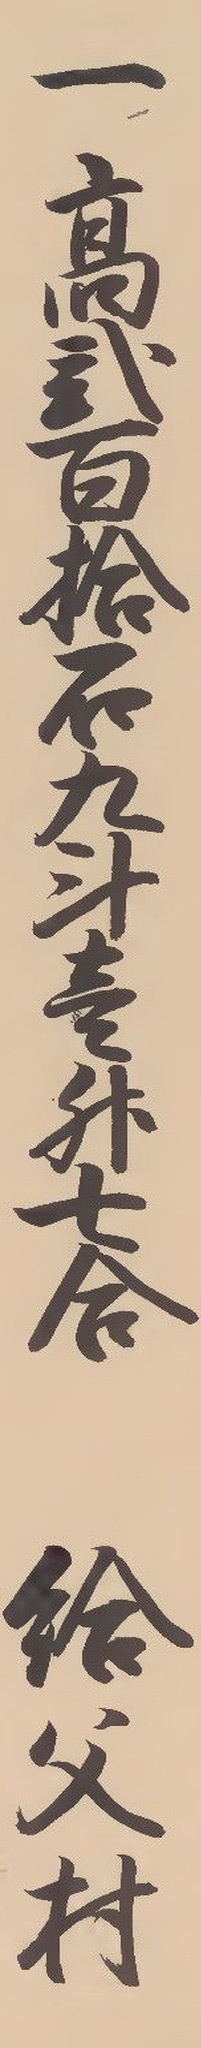一高弐百拾石九斗壱升七合給父村
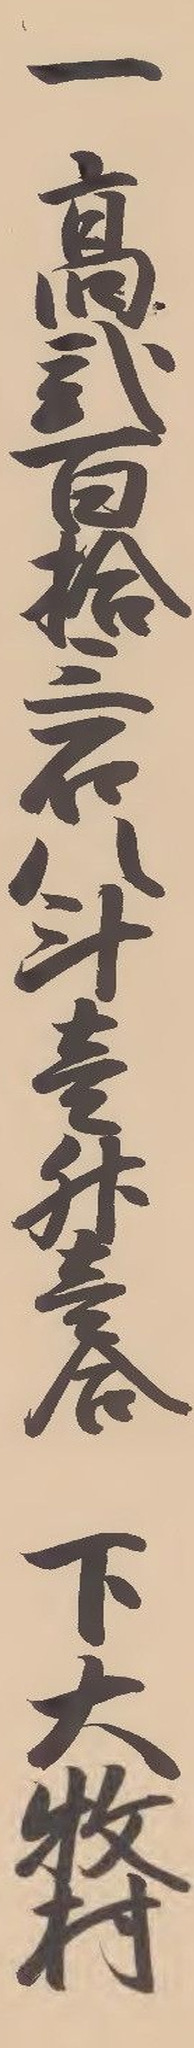一高弐百拾三石八斗壱升壱合下大牧村
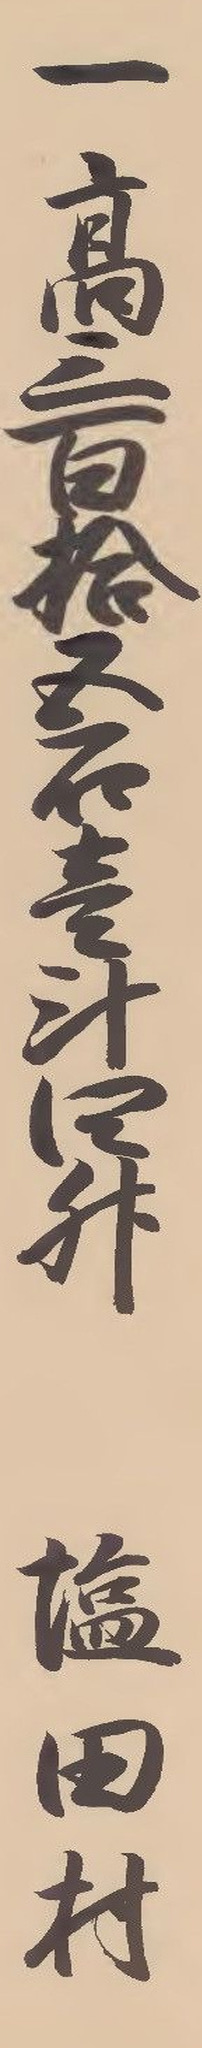一高三百拾五石壱斗四升塩田村
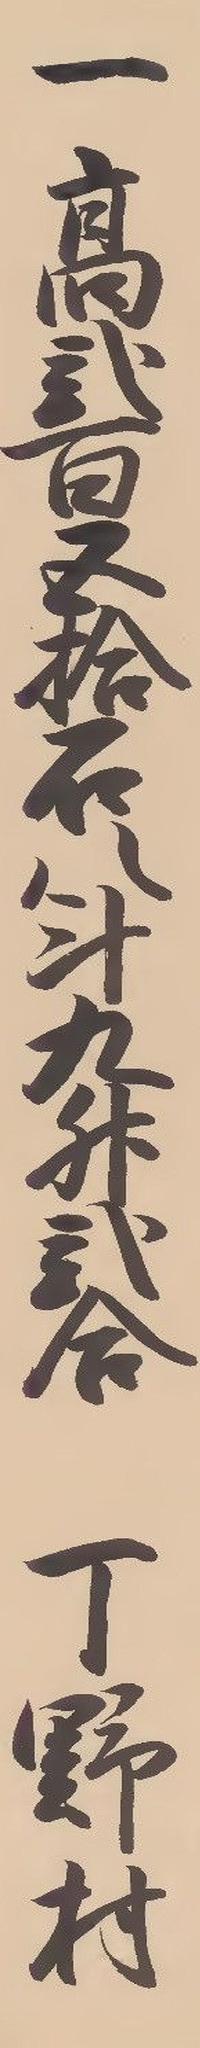一高弐百五拾石八斗九升弐合丁野村

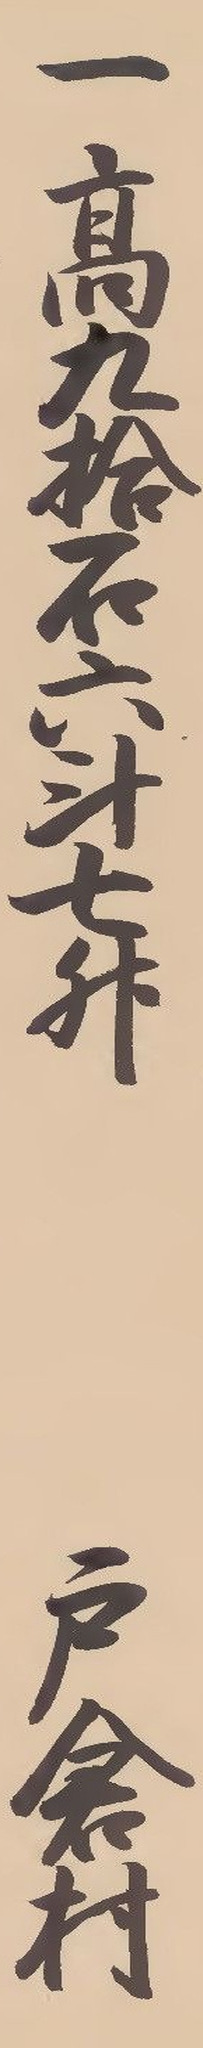一高九拾石六斗七升戸倉村
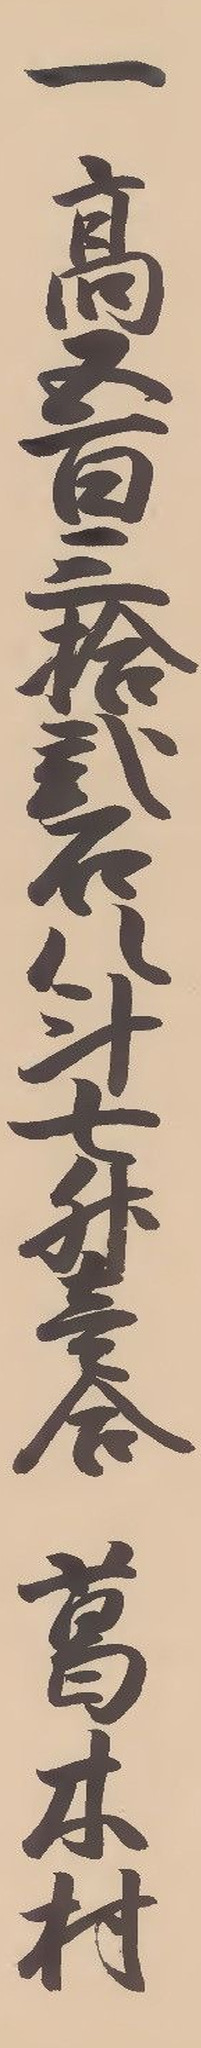一高五百三拾弐石八斗七升壱合葛木村
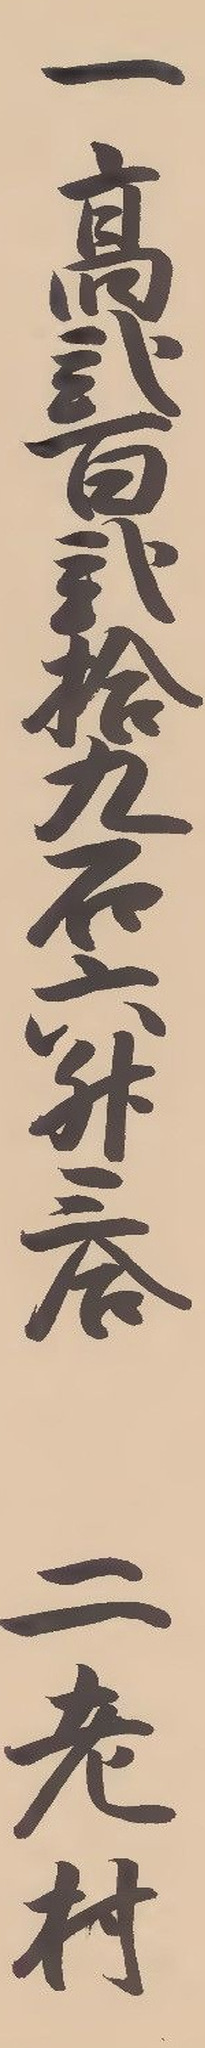一高弐百弐拾九石六升三合二老村
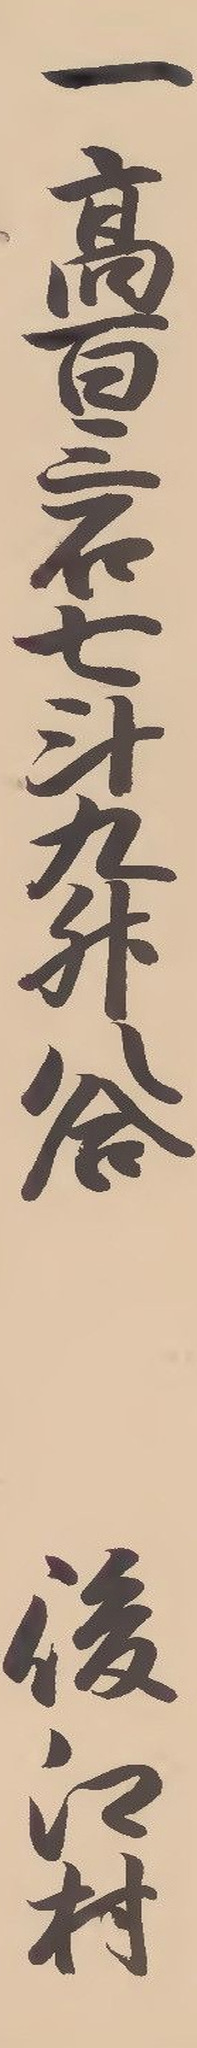一高百三石七斗九升八合後江村
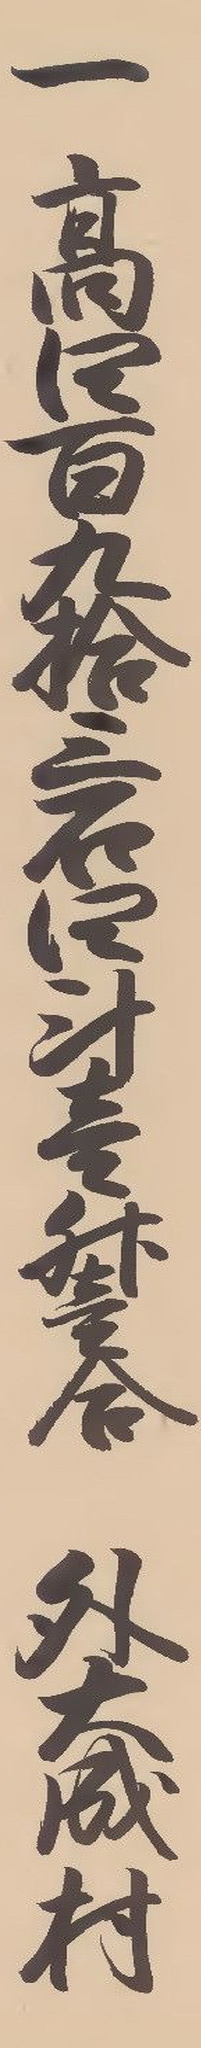一高四百九拾三石四斗壱升壱合外大成村
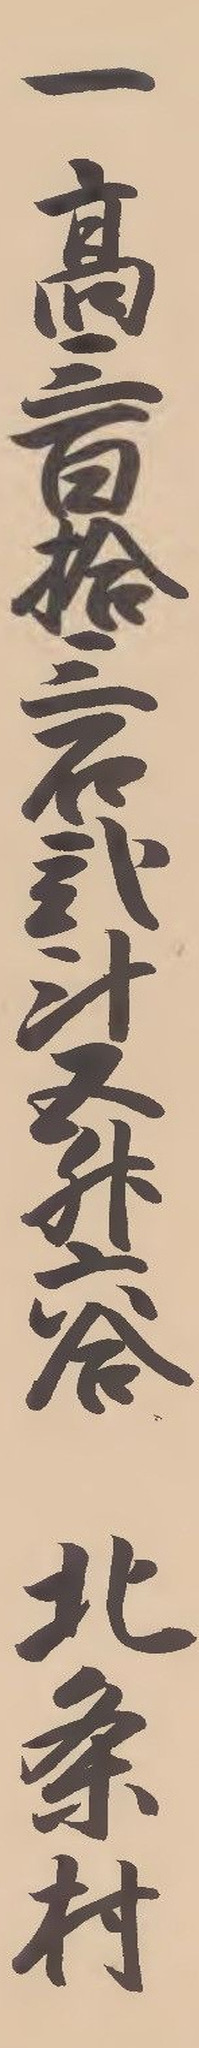一高三百拾三石弐斗五升六合北条村
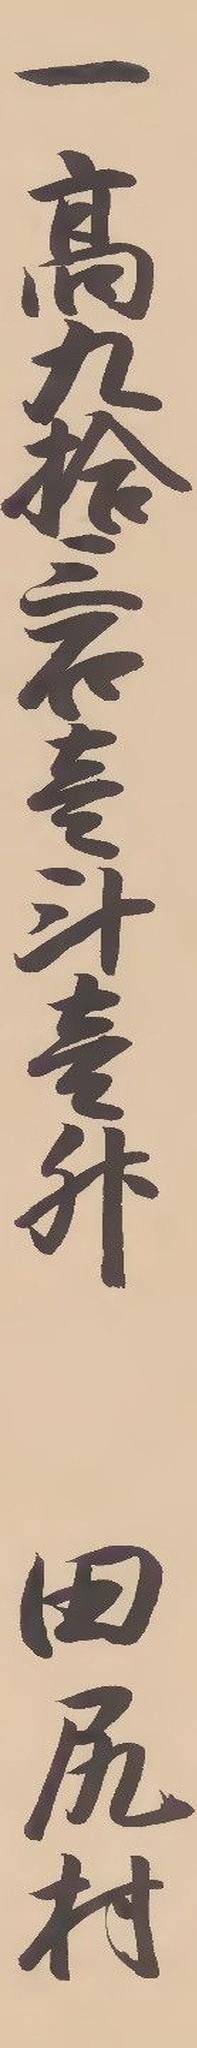一高九拾三石壱斗壱升田尻村

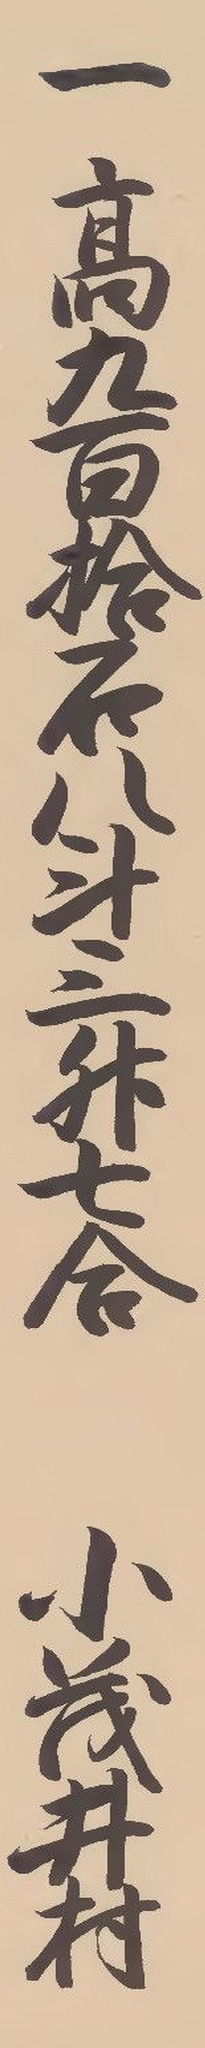一高九百拾石八斗三升七合小茂井村
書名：尾張国郷帳
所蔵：国立公文書館 National Archives of Japan
